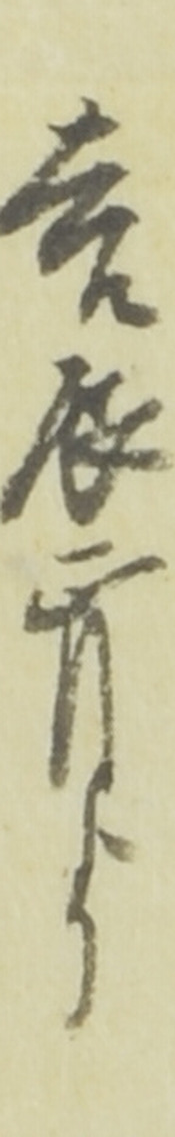去ル辰正月より
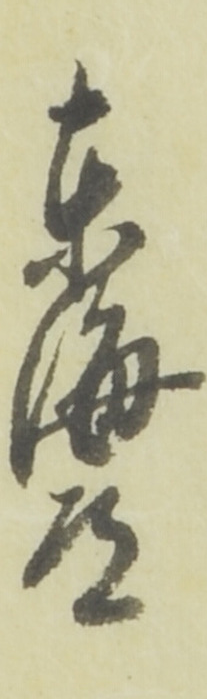東海道
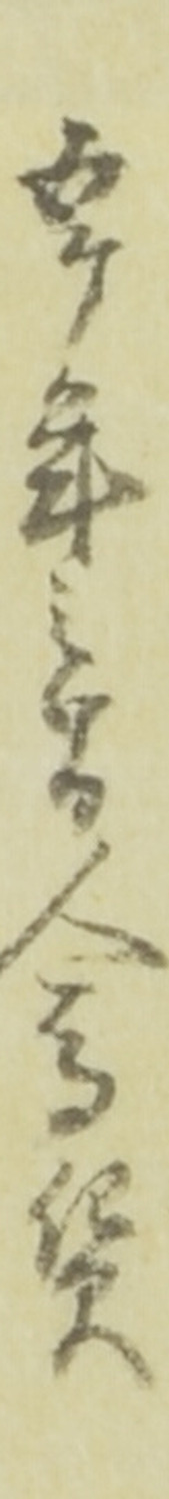五ヶ年之間人馬賃
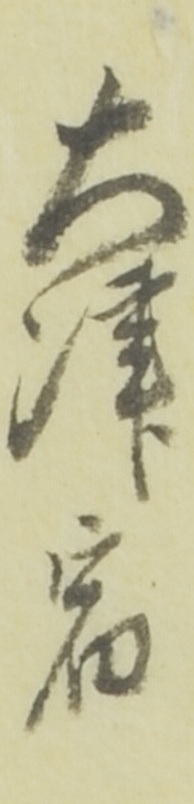興津宿
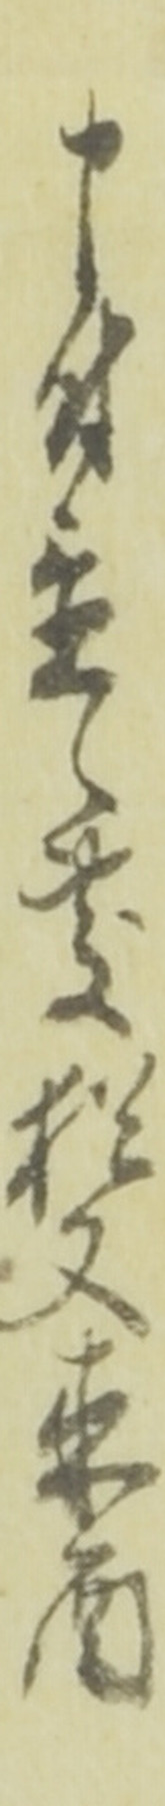申付置候処猶又来酉
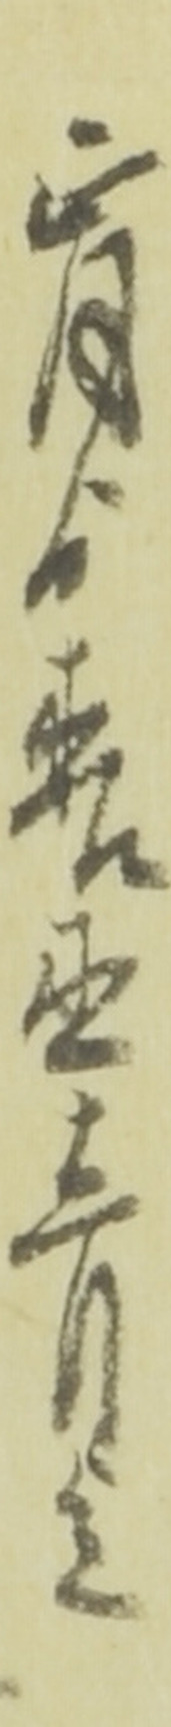正月ゟ来ル丑十二月迄
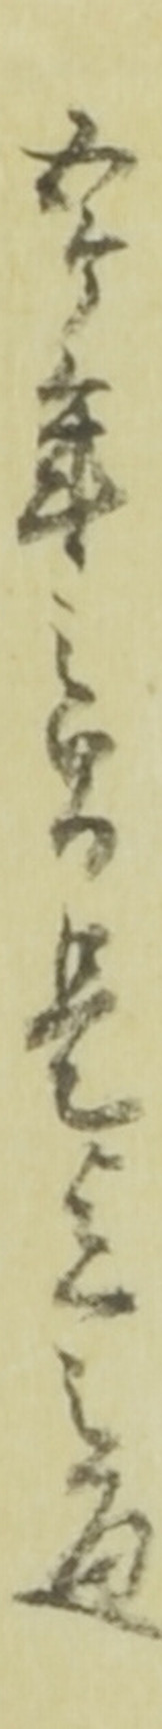五ヶ年之間是迄之通
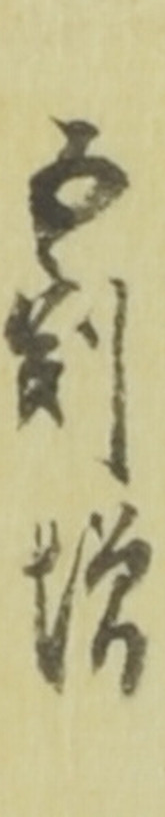五割増
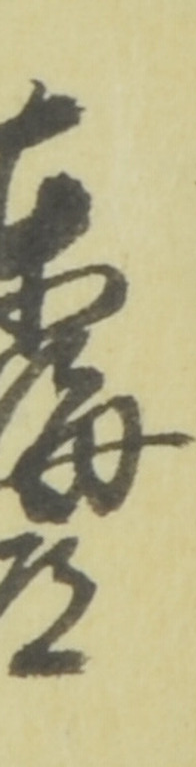東海道

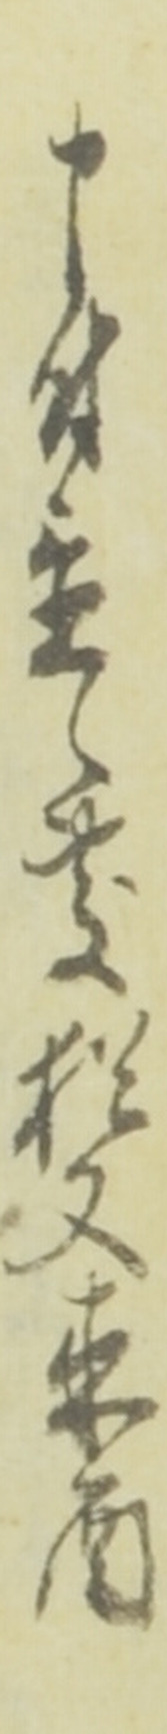申付置候処猶又東西
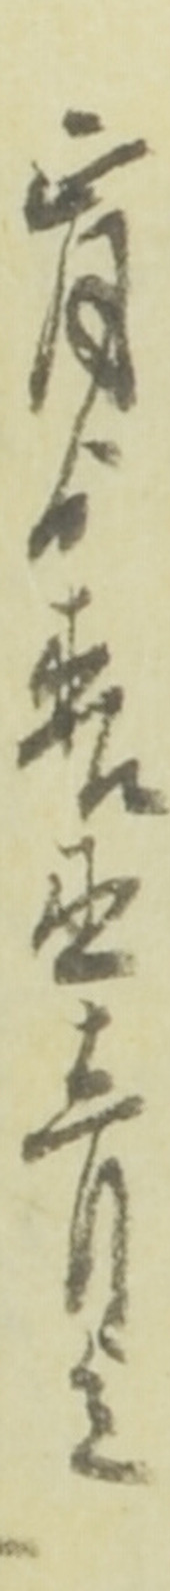正月ゟ来ル丑十二月迄
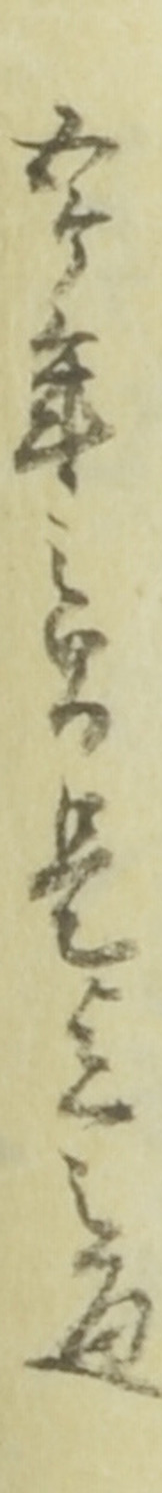五ヶ年之間是迄之通
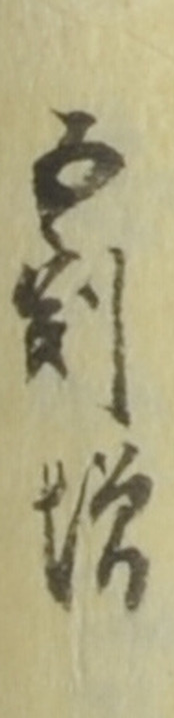五割増
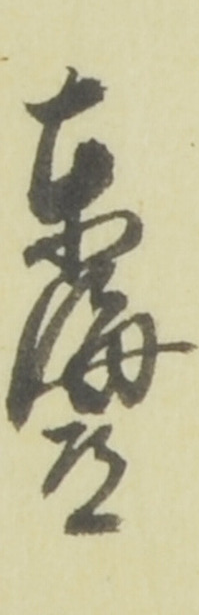東海道
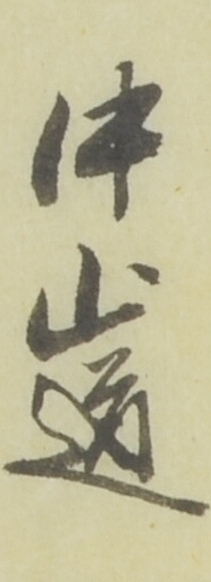中山道
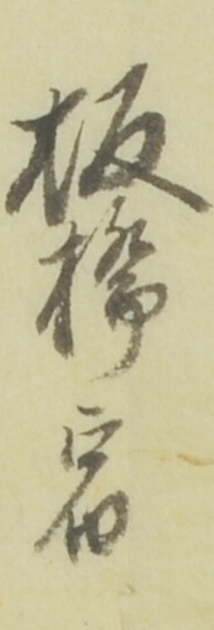板橋宿
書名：御触書御書附控
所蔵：伊那市立高遠町図書館・合同会社AMANE
